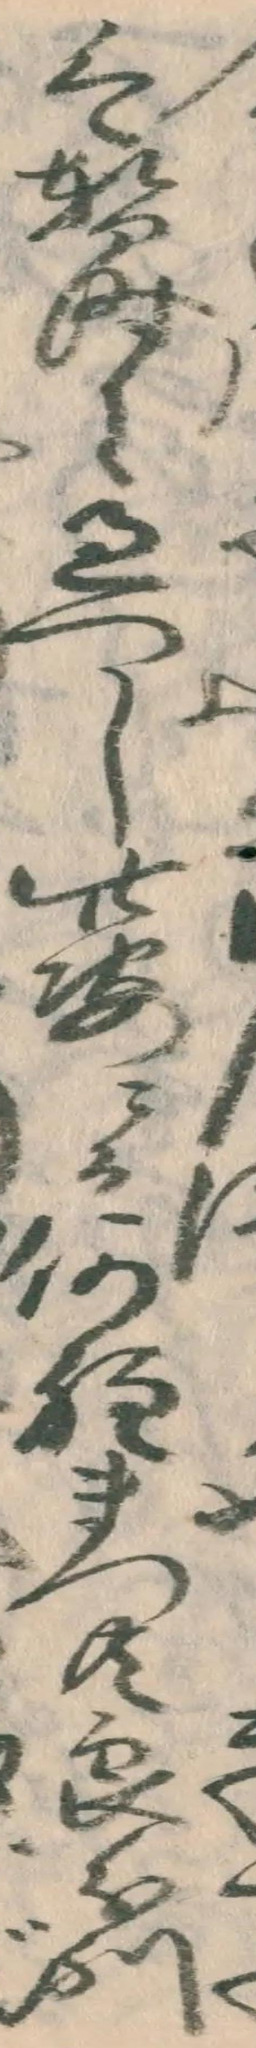は暫時に過へし此姿ニ而何程まつ共良分別
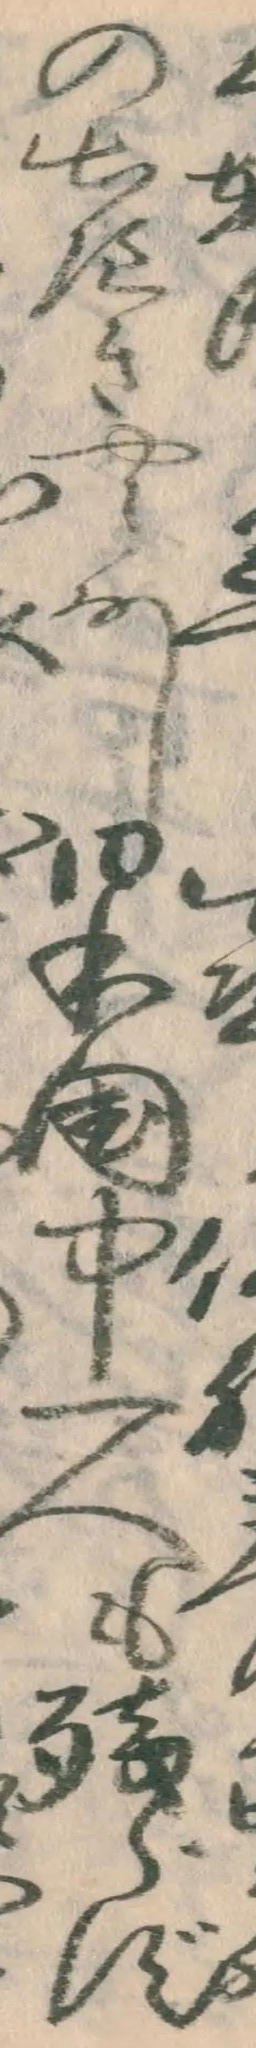の出へきやうなし日本国中一人も残らず
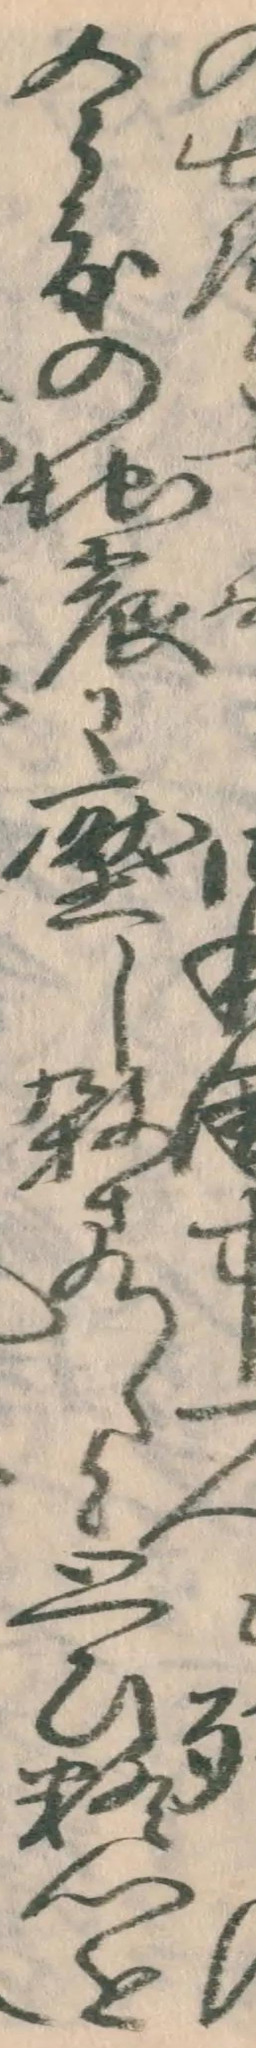今度の地震に壓し殺され候と思ひ疑心を
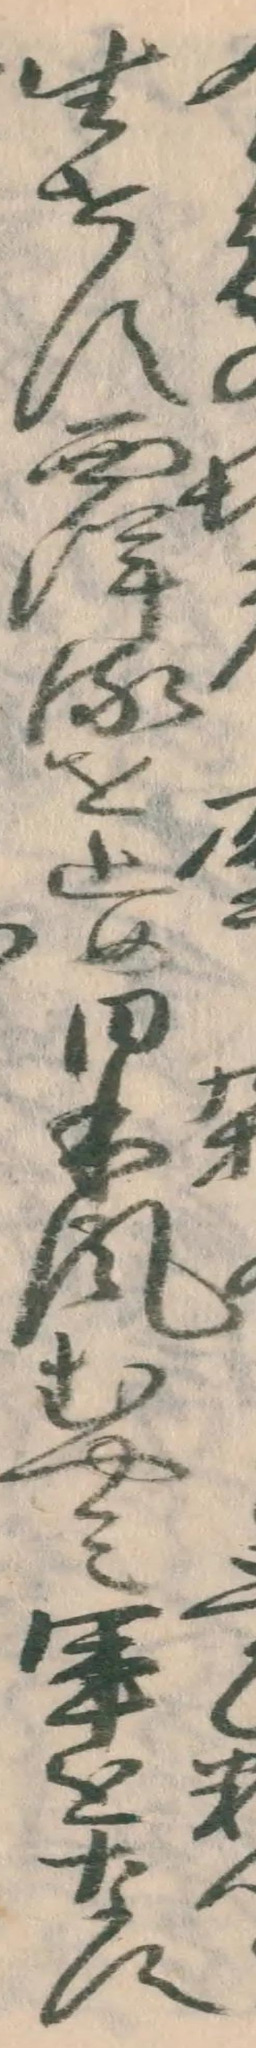生せす西洋流を止め日本風むやミ軍をなす
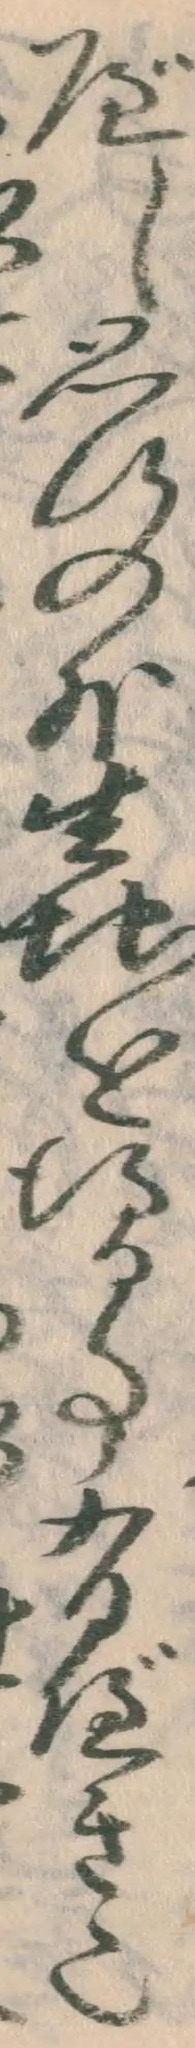べし思ひの外生地を得る事有べき也
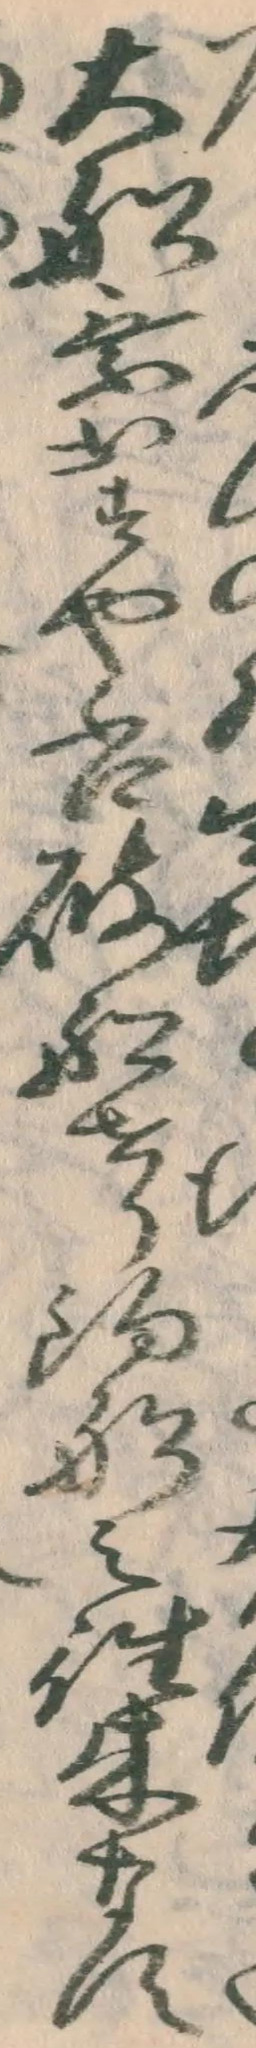大船乗出すや否破船せり釣船之往来なす
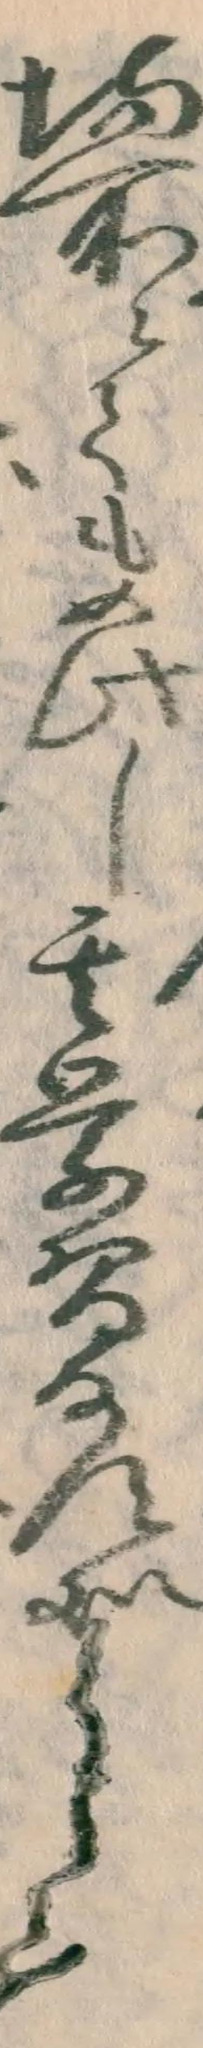場所ニても如此し其学習なす処
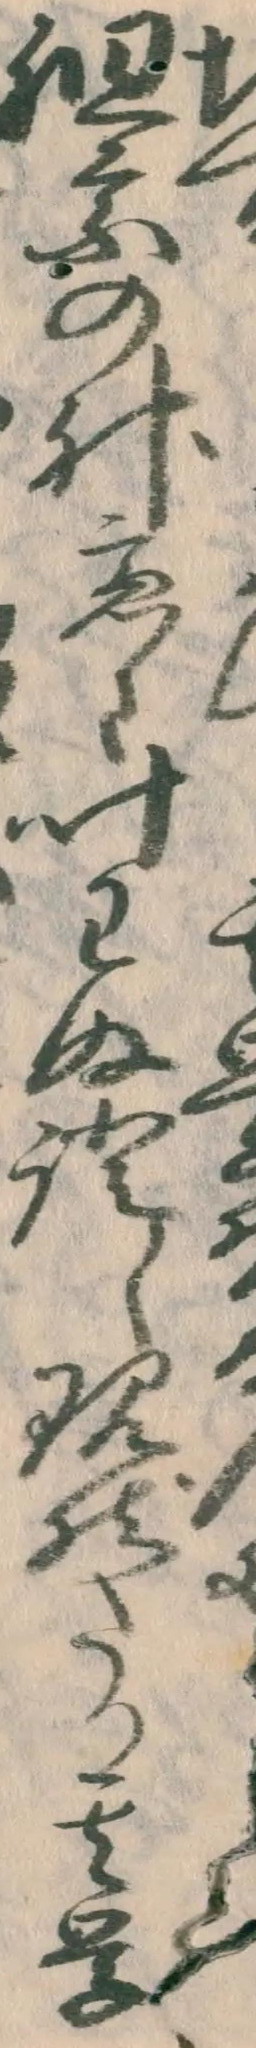祖宗の神慮に叶わぬ證し現然たり其学
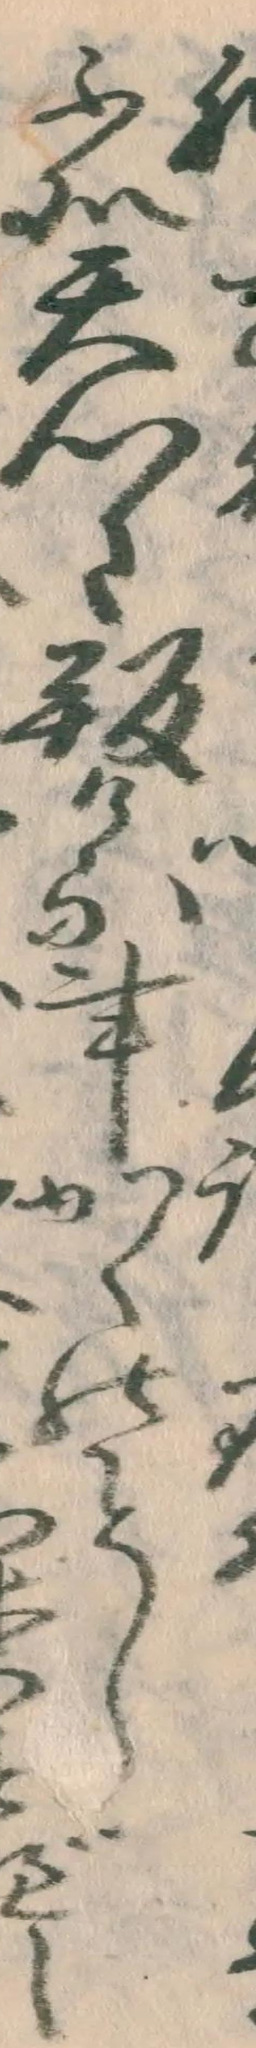ふ処天心に叛ける事かくのことし
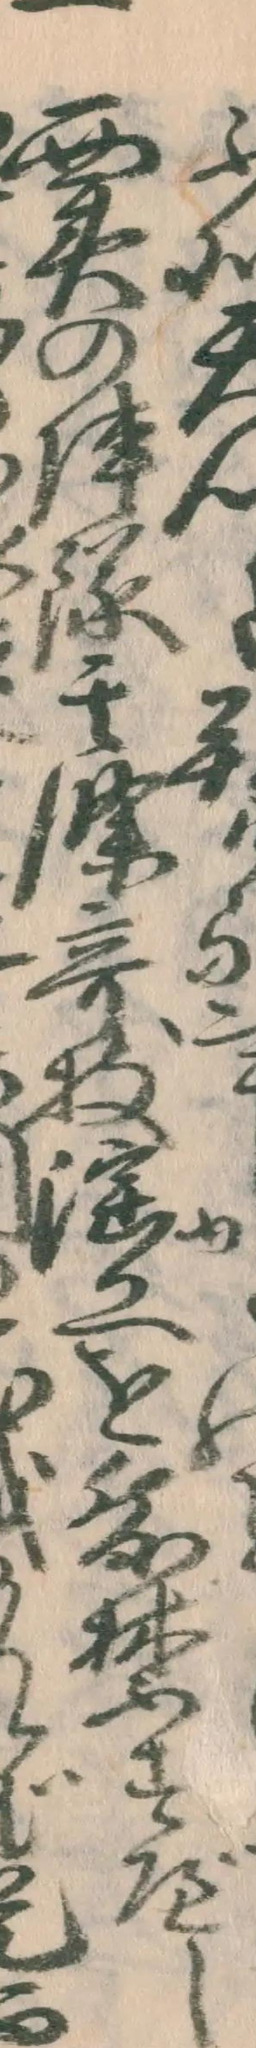一西夷の陣隊其餘奇技淫工を発禁すべし
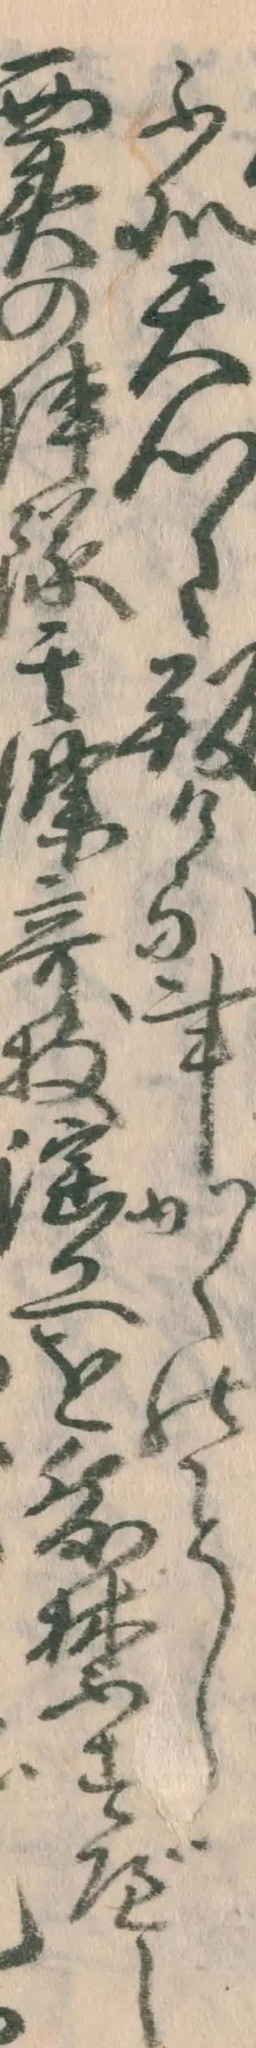一西夷の陣隊其餘奇技淫工を発禁すべし
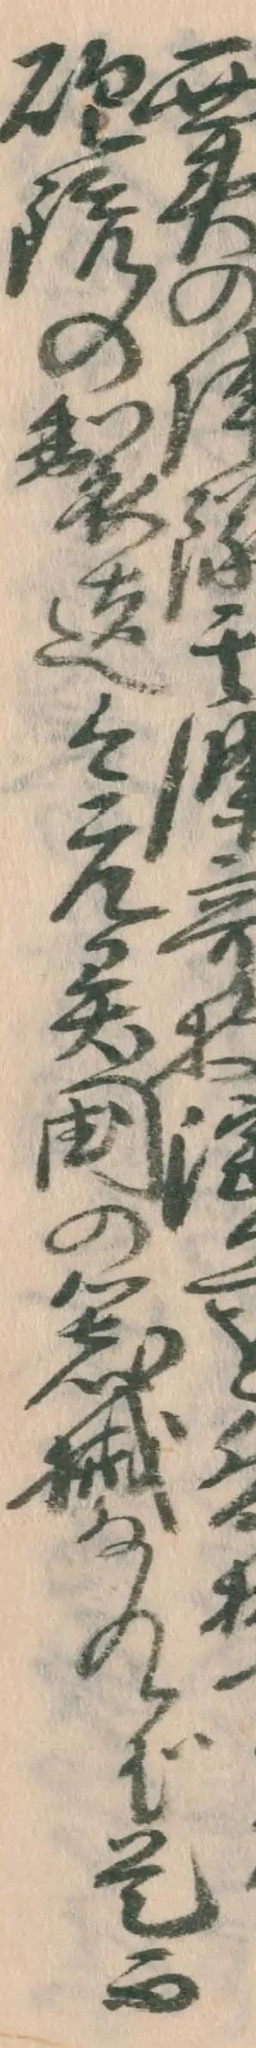砲銃の製造は元異国の器械なれば是而
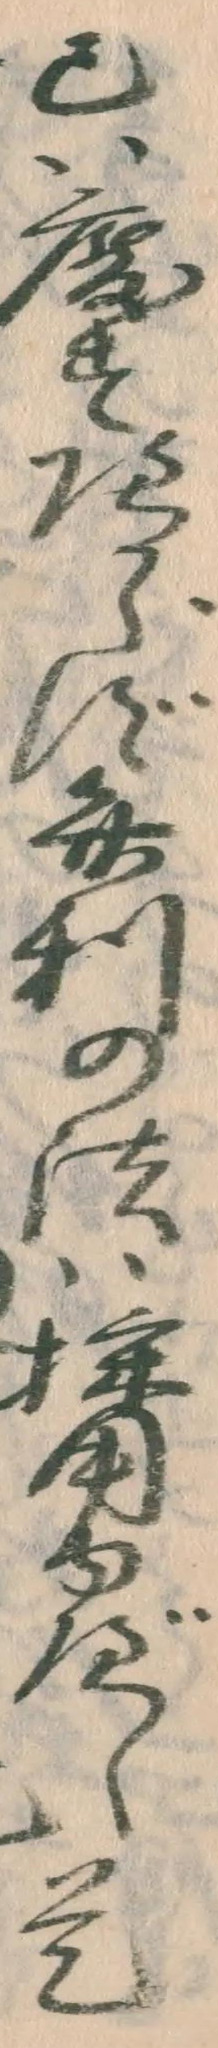已ハ廃すへからず弁利の法ハ採用ゆべし是
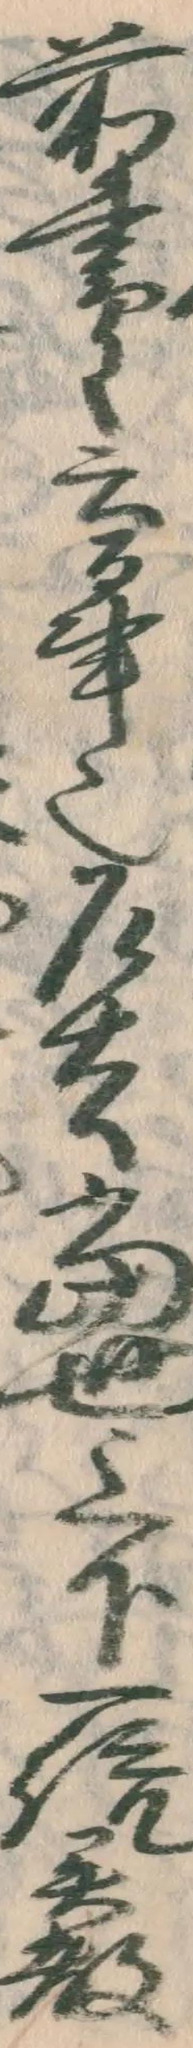前書に云る事也乍去當世上下一統異教
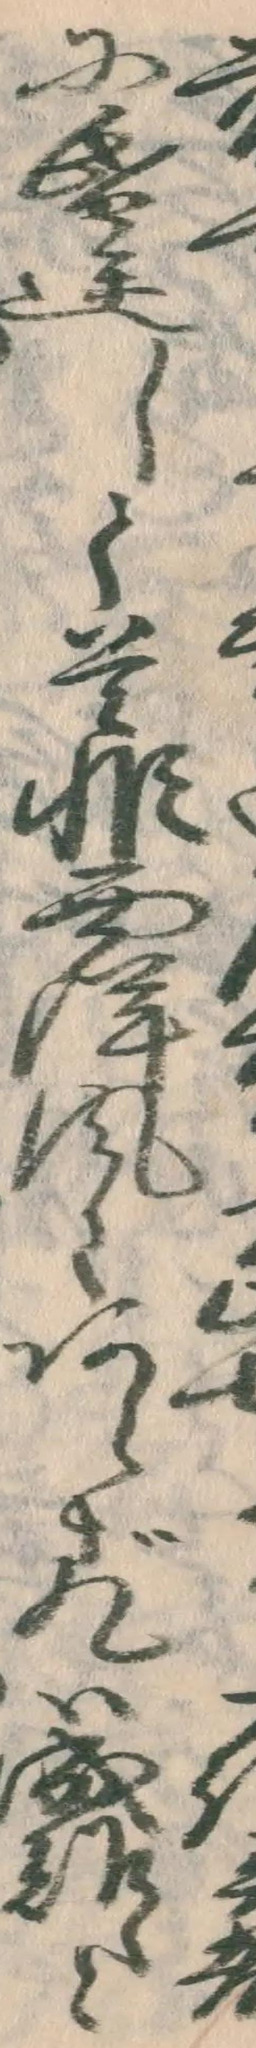に昏迷して是非西洋風にあらざれハ成難しと
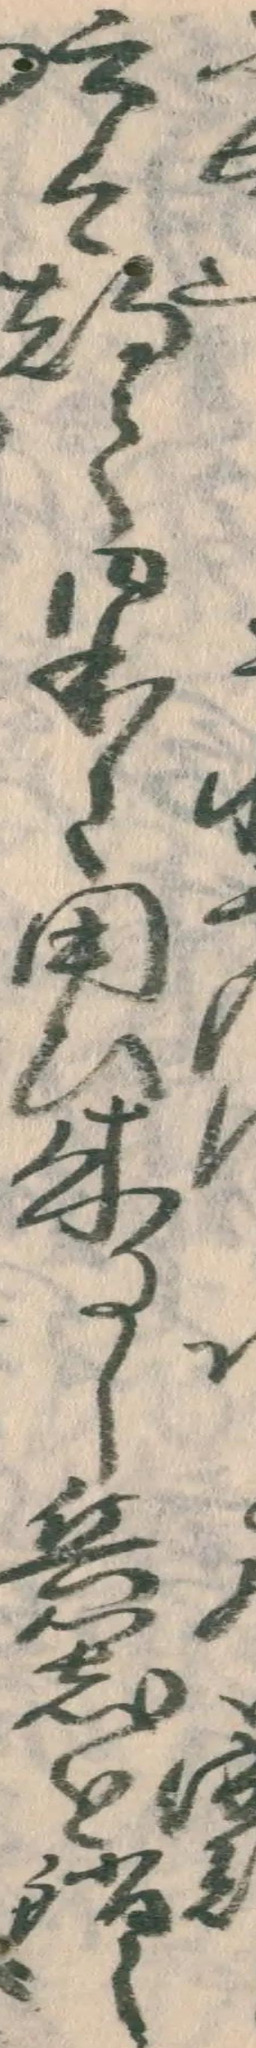云は都て日本に用ひ来りし兵器を銷し
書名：麗斎叢書. 20
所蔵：国立国会図書館 National Diet Library, JAPAN
